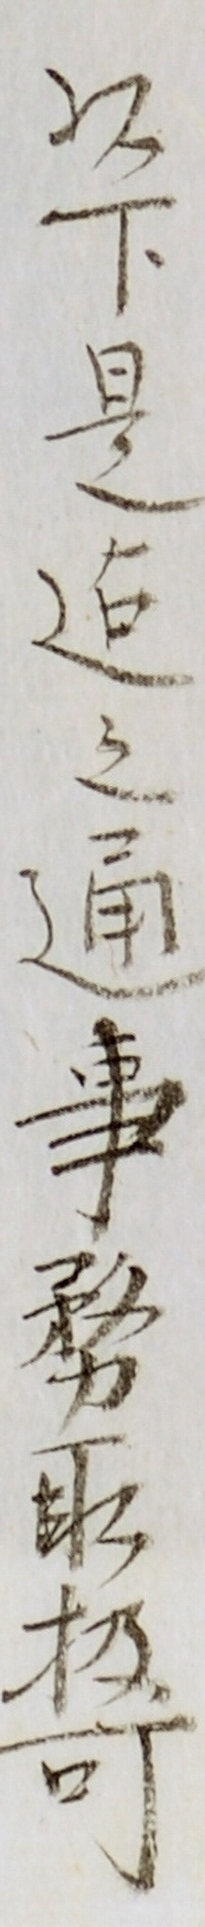以下是迄之通事務取扱可
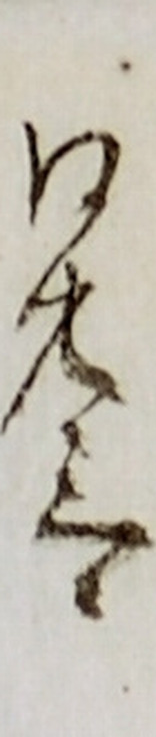同廿三日
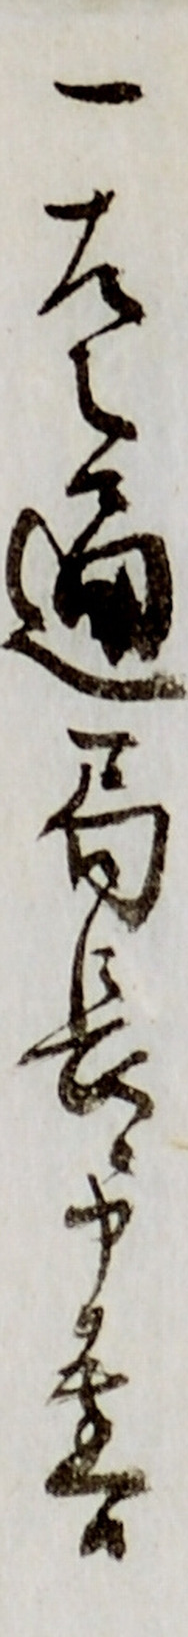一左之通局長へ申達候
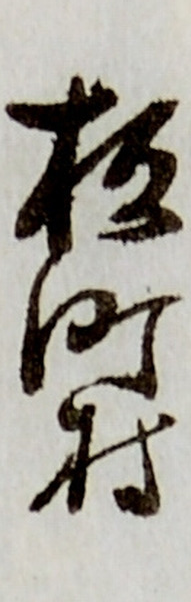板町村
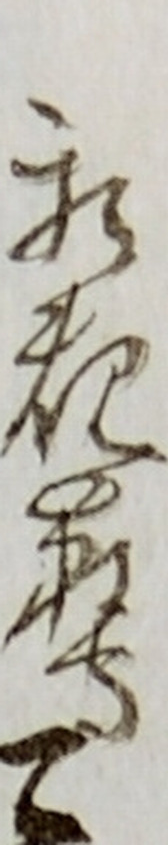新規薮守
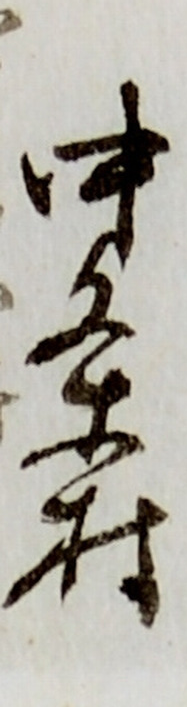中条村
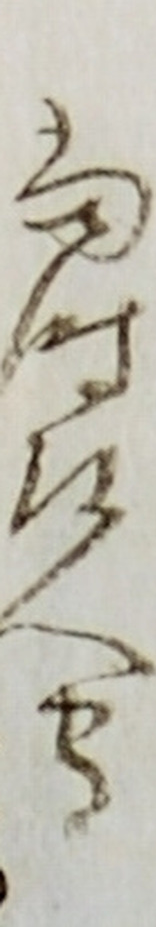当時役人守
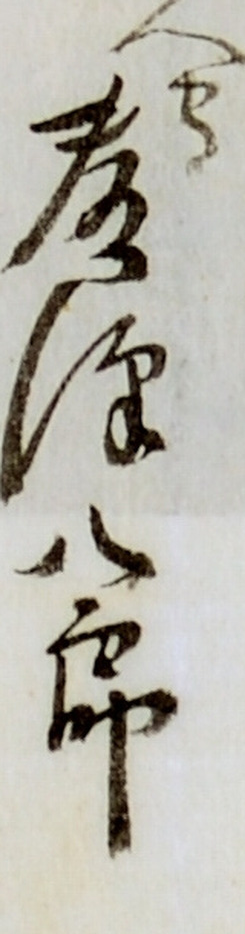藤沢八郎
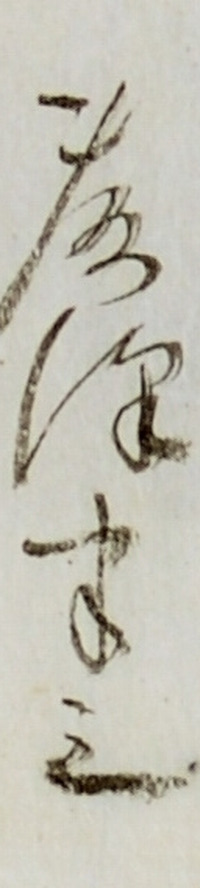藤沢半三

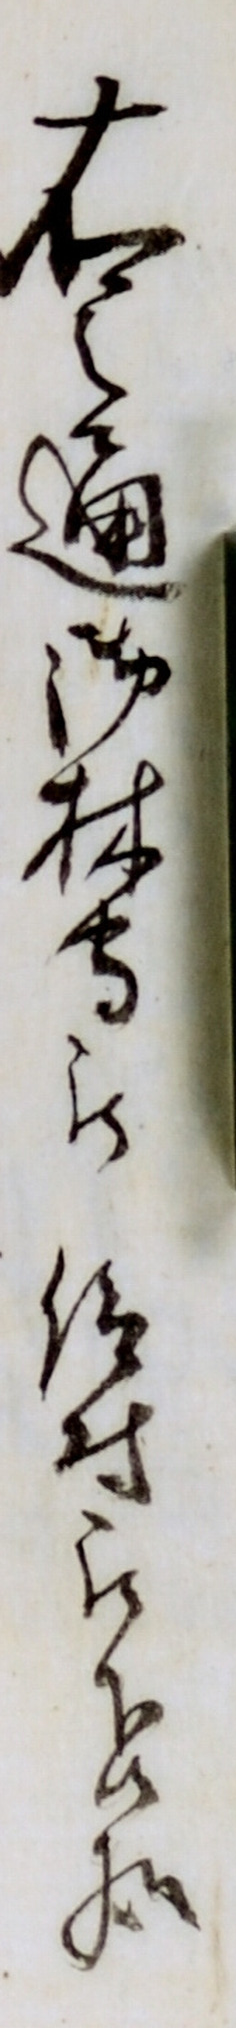右之通御林守被仰付被下候様
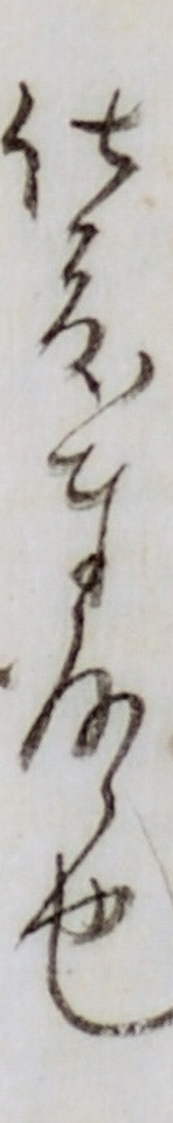仕度奉存候也
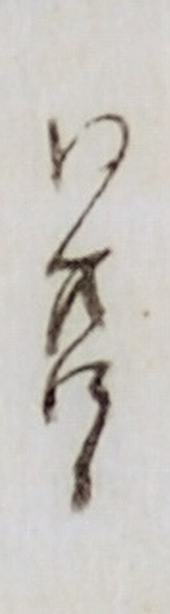同廿四日
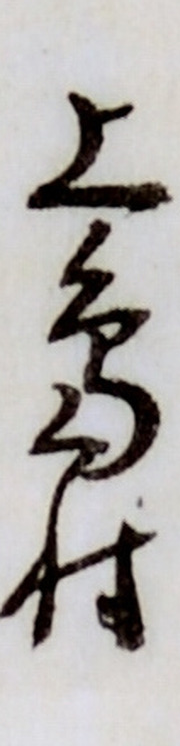上島村
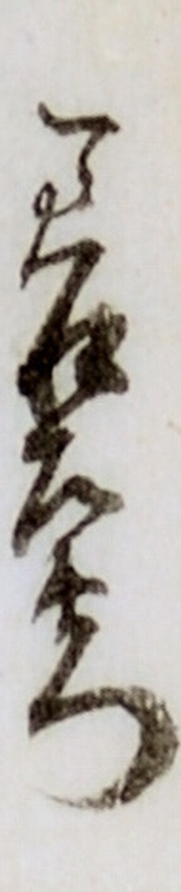善左衛門
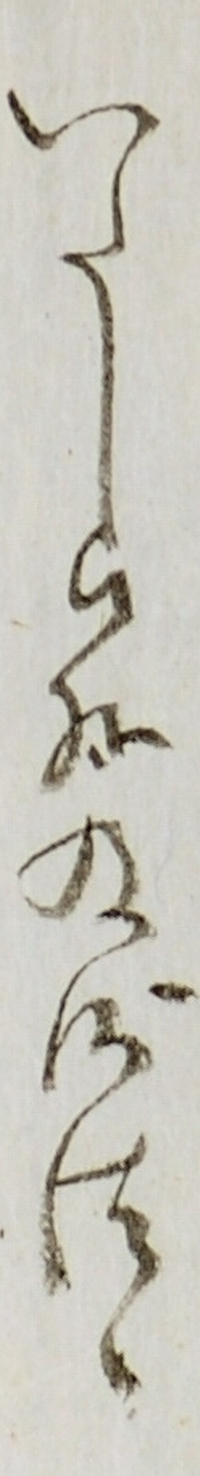いたし候様及沙汰候
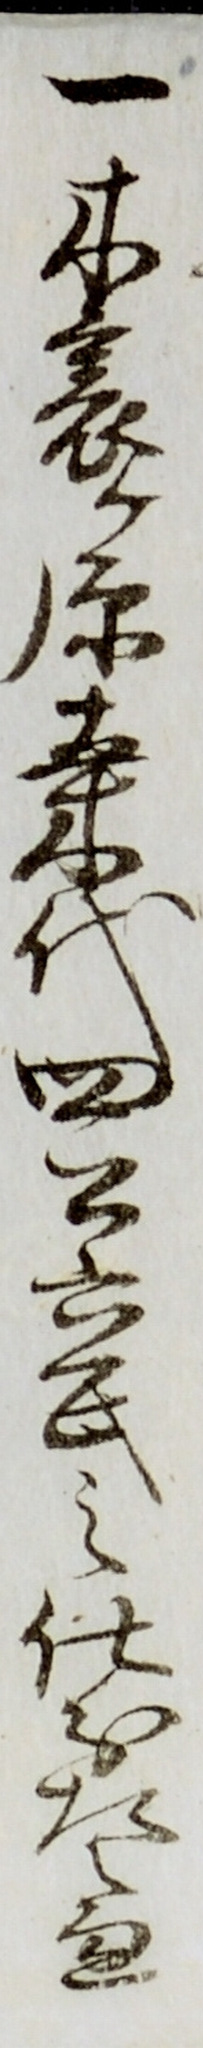一木裏ヶ原桑代四公六民之仕分左之通
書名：山林方諸事御用留
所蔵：伊那市立高遠町図書館・合同会社AMANE
